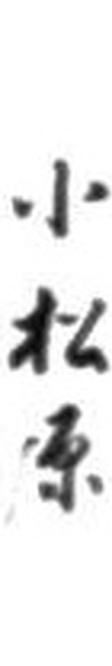小松原
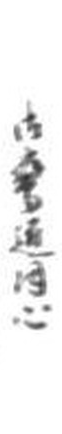御鷹匠同心
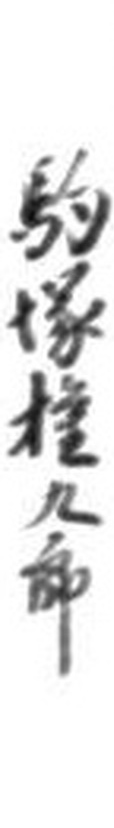駒塚権九郎
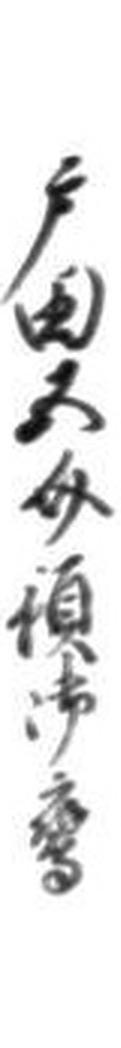戸田五介預御鷹
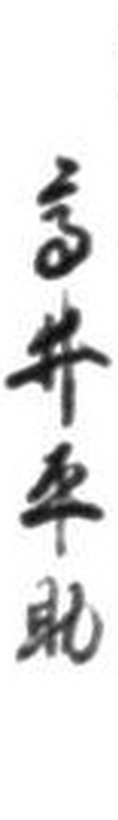高井平助

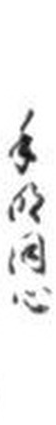手明同心
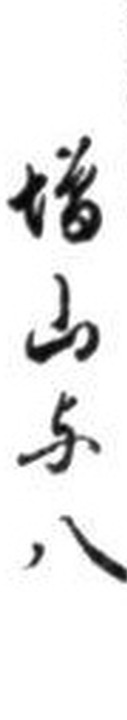増山与八
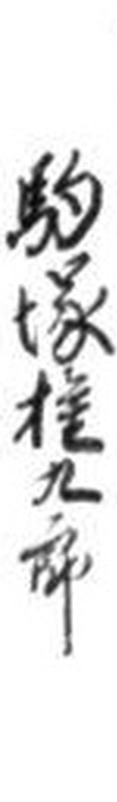駒塚権九郎
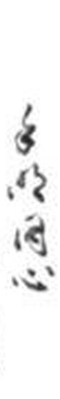手明同心
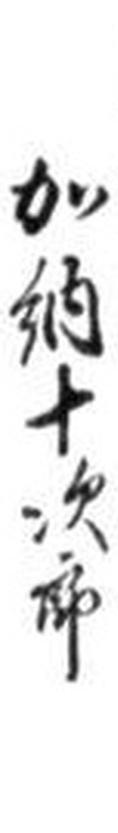加納十次郎
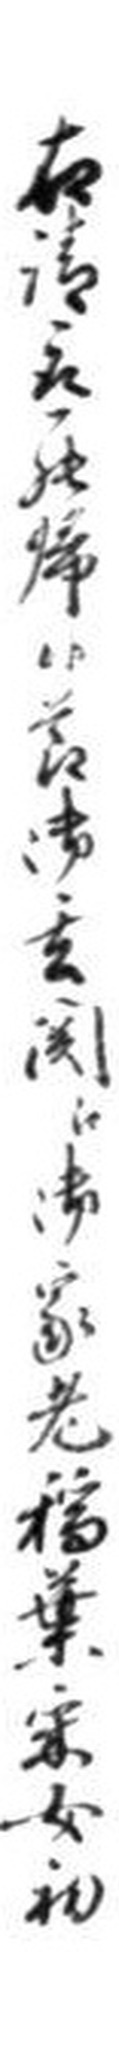右請取罷帰候節御玄関江御家老稲葉采女初
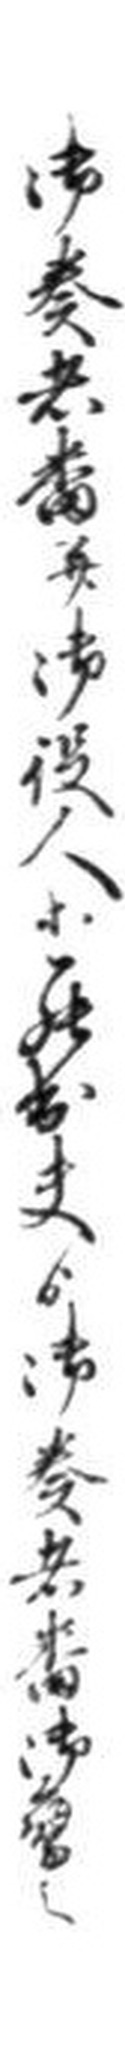御奏者番并御役人等罷出夫ゟ御奏者番御鷹之
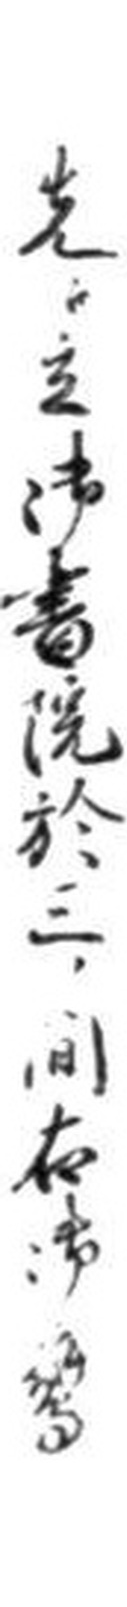先江立御書院於三ノ間右御鷹
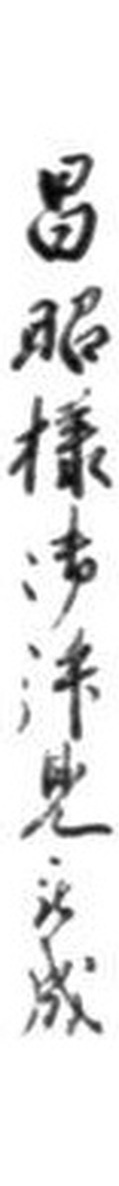昌昭様御拝見被成
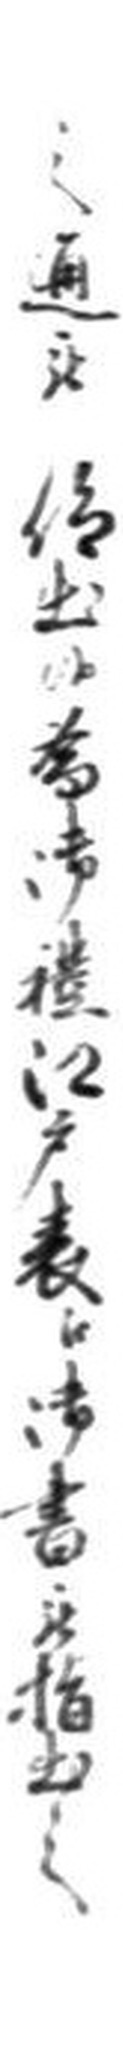之通被仰出候為御礼江戸表江御書被指出之
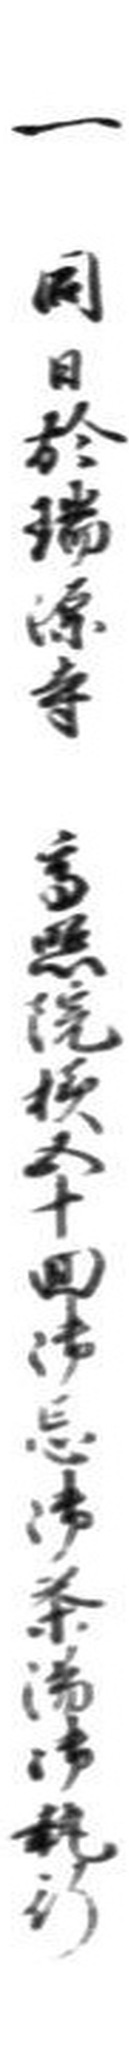一同日於瑞源寺高照院様五十回御忌御茶湯御執行
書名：家譜 三十五 宗昌公 従享保六年到同七年
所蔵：福井県文書館 Fukui Prefectural Archives
